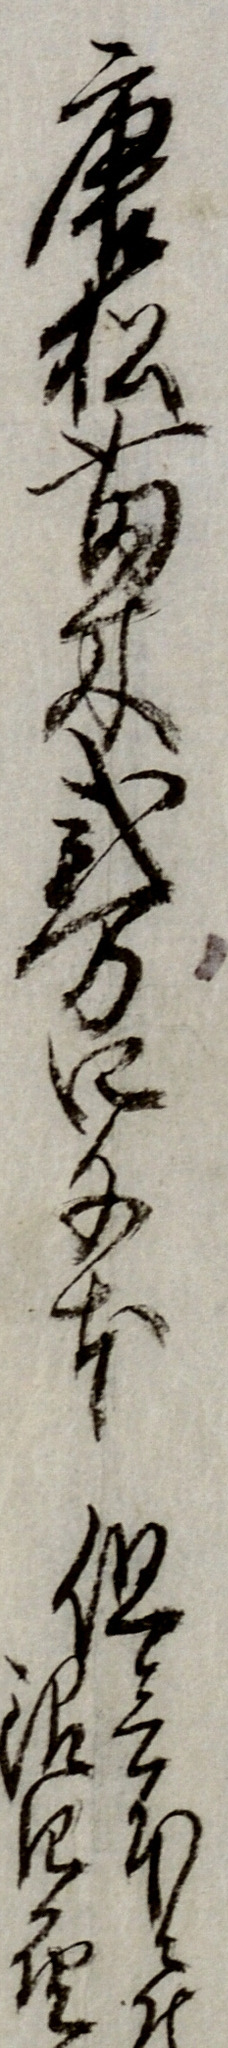唐松苗木弐万四千本但壱本ニ付
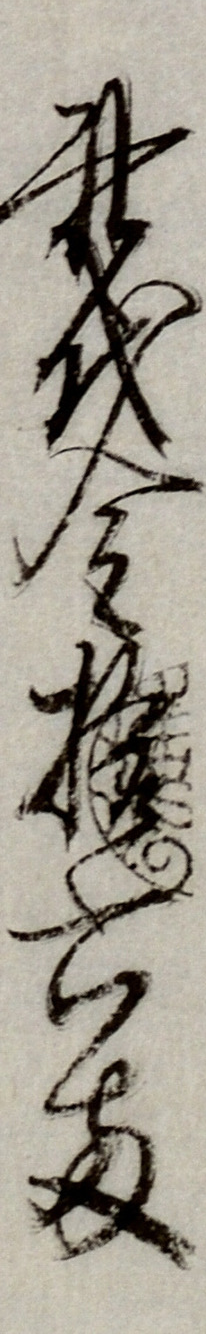此代金拾六両
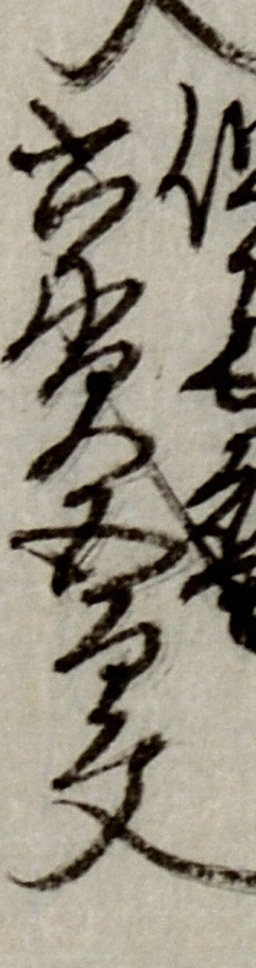六貫五百文
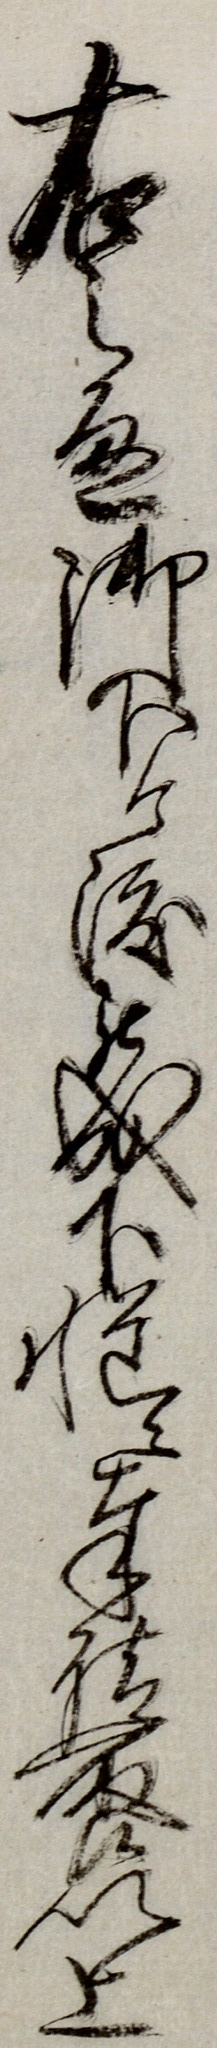右之通御下ケ渡被成下慥ニ奉請取候以上
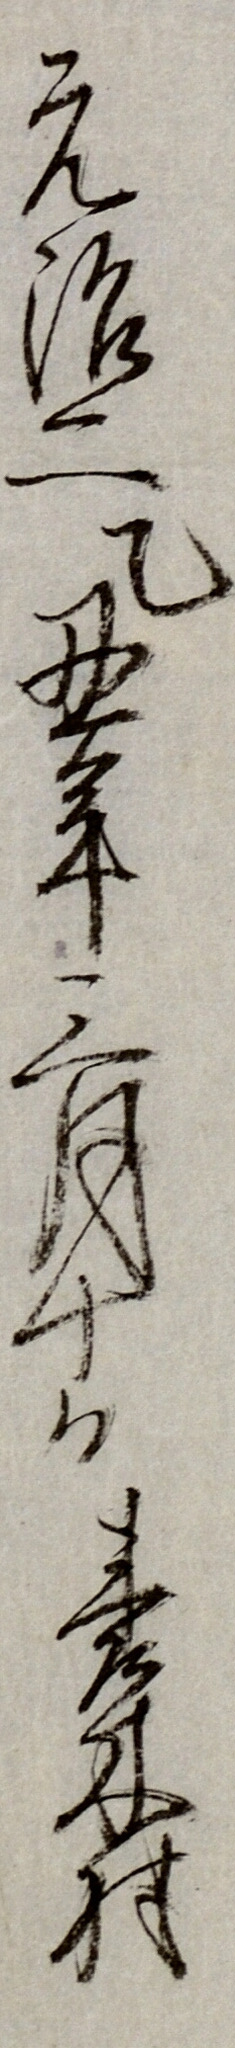元治二乙丑年三月十日表木村
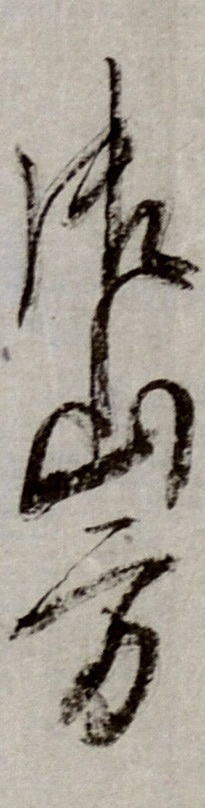御山方
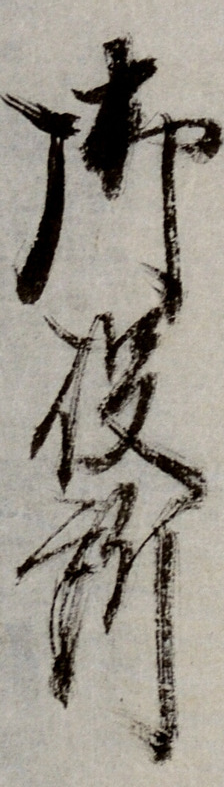御役所
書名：覚
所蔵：伊那市立高遠町図書館・合同会社AMANE
